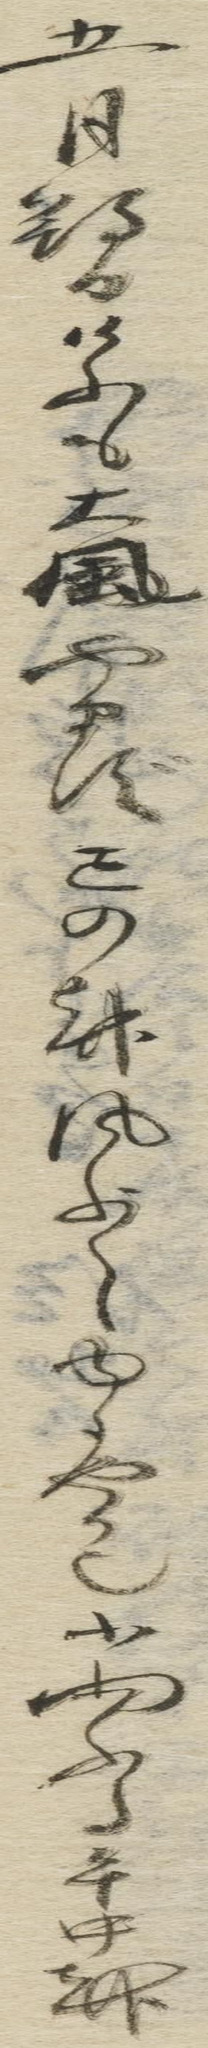五月朔日けふも大風やまず巳の刻風少しゆるやか也小雨ふる午中刻
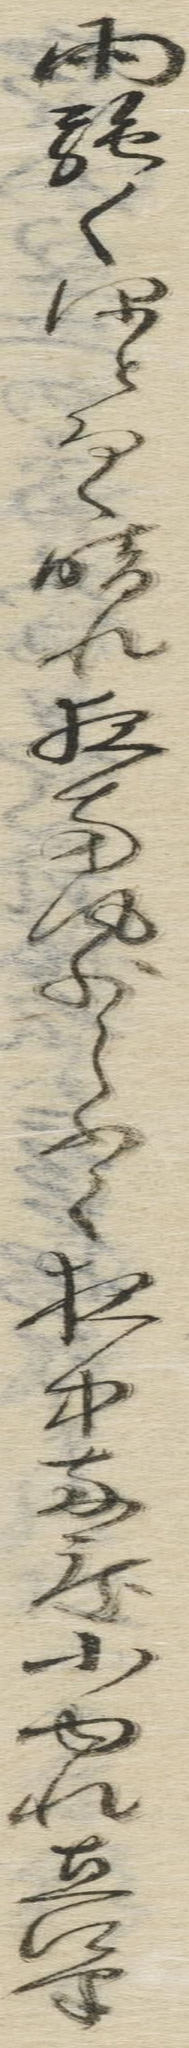雨強くほとなく晴れ夜南風少しふく夜中両度小ゆれ直江津
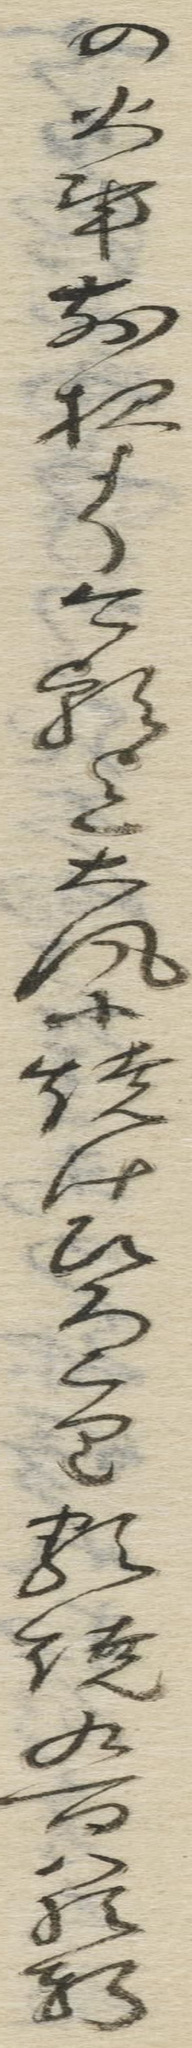の火事前夜より今朝迄大風に焼けひろくり類焼九百八拾軒
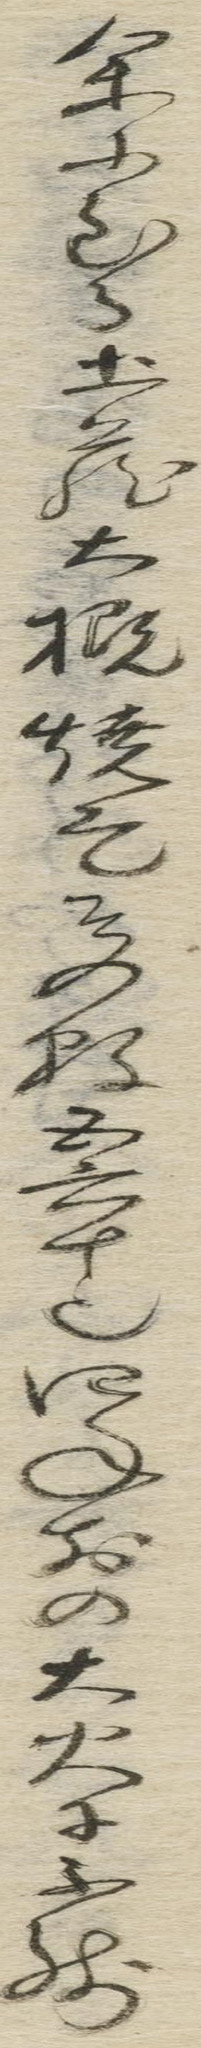余に至る土蔵大概焼亡その数五六十也四年前の大火に不残
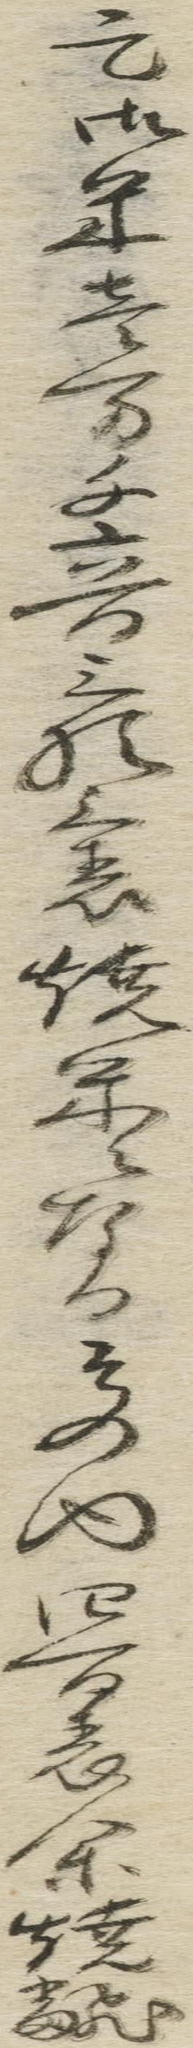亡御米壱万千六百三拾三表焼米二なるその内四百表余焼飜
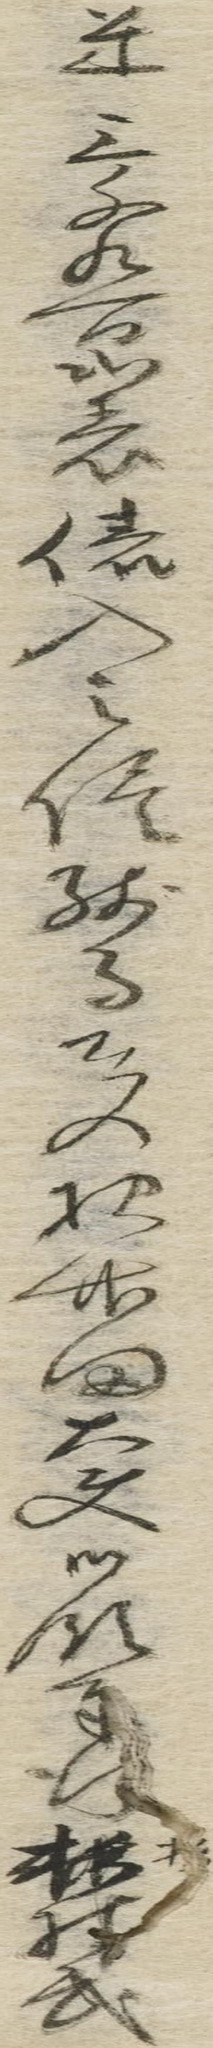米三千九百弐表俵入の儘残るその夜竹田太夫御領奉行杉村武
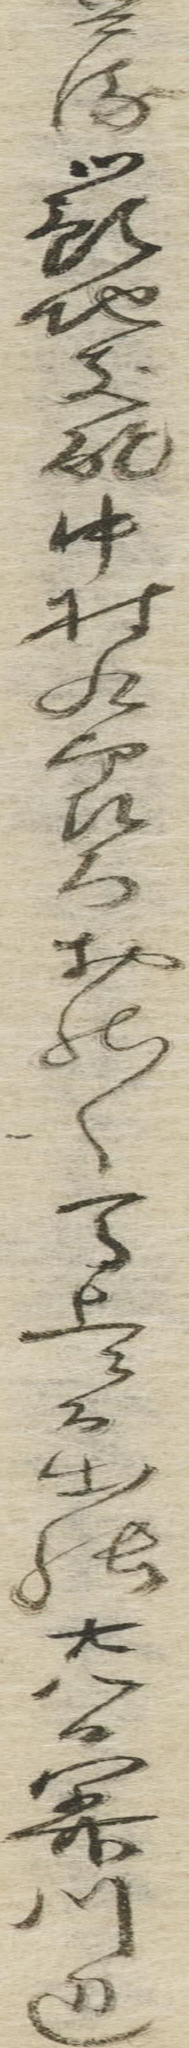兵衛御預地支配中村九郎左衛門おの〳〵馬上二而出張廿八日関川辺
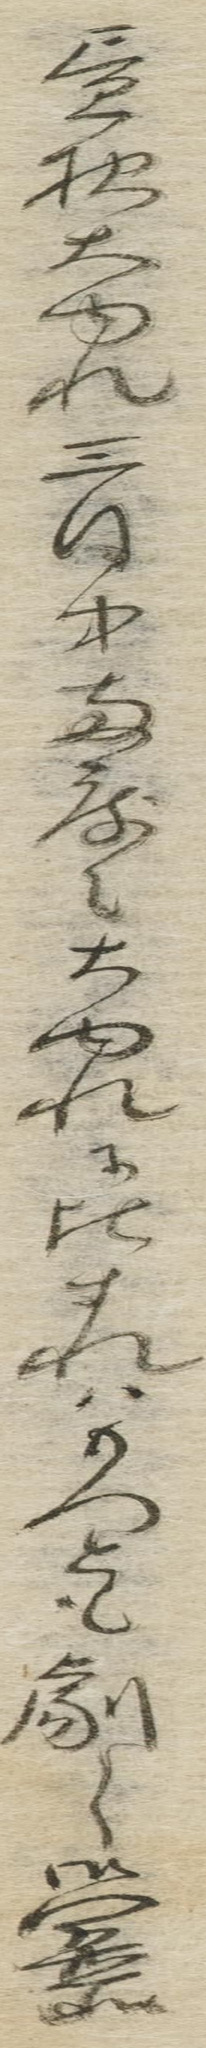昼夜大ゆれ三月中両度之大ゆれに比すれハもつとも劇し御関所
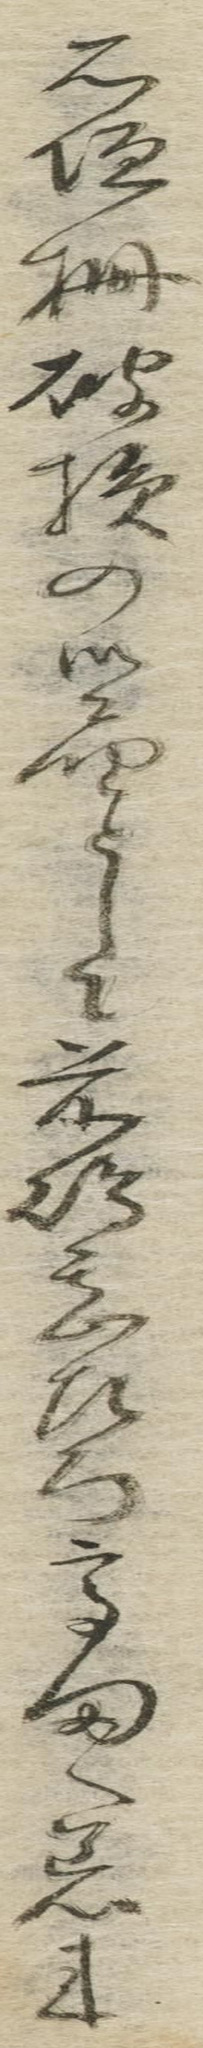石垣柵破損の御届として前嶋甚左衛門高田へ着来
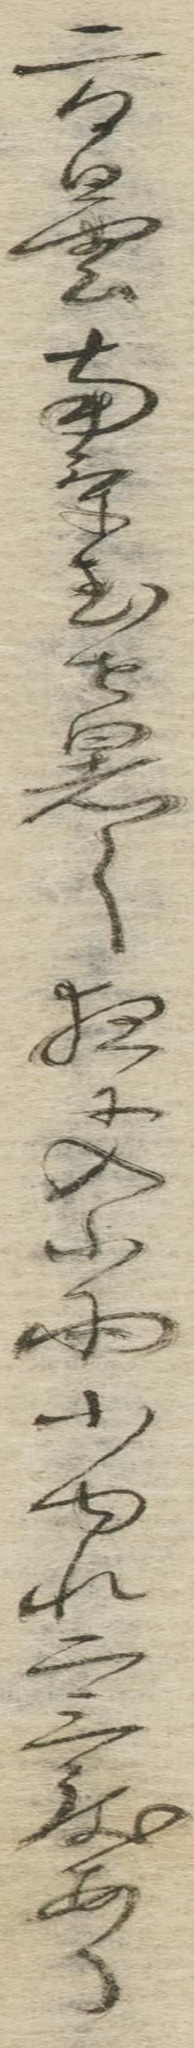二日曇南気至て暑し夜に入小雨小ゆれ二三度あり

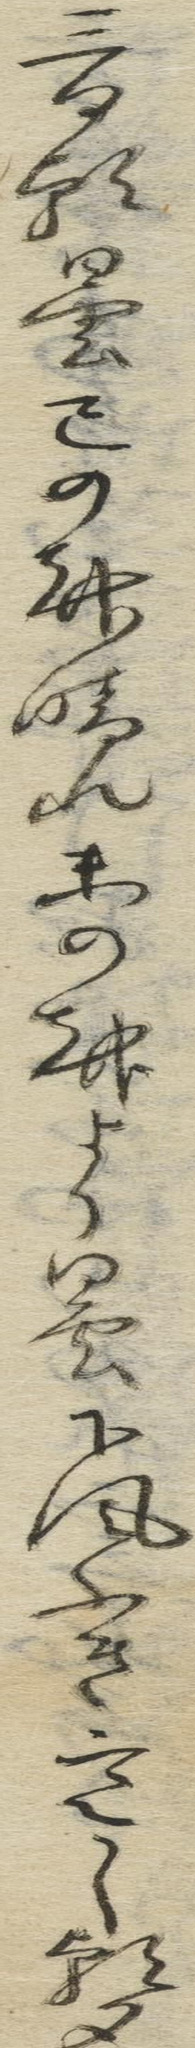三日朝曇巳の刻晴れ未の刻より曇下風ふき寒し朝夕
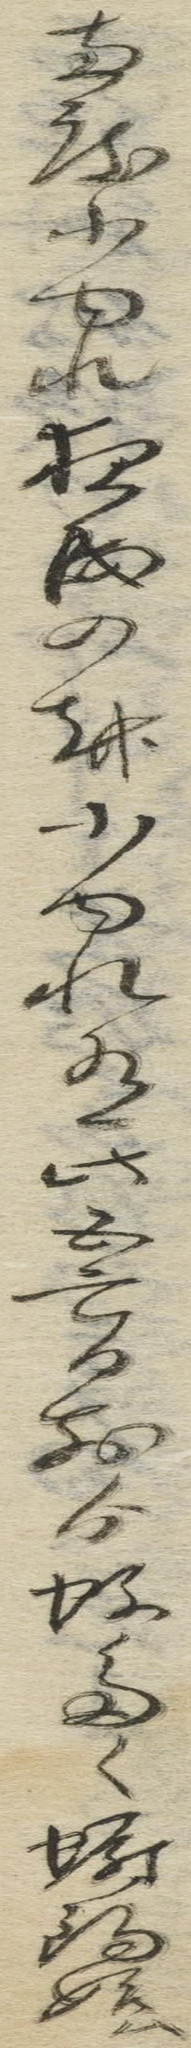両度小ゆれ夜戌の刻小ゆれ有此五六日前ゟ蚊多く蟵釣始ム
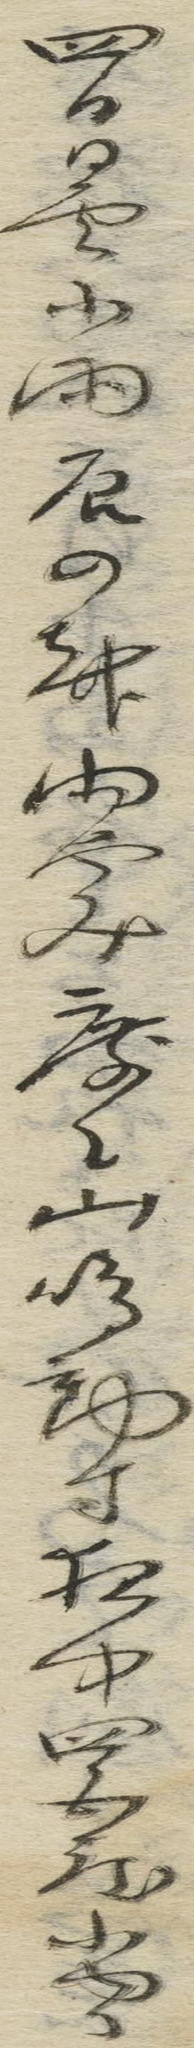四日曇小雨辰の刻雨やみ度々山鳴動す夜中四五度小ゆり
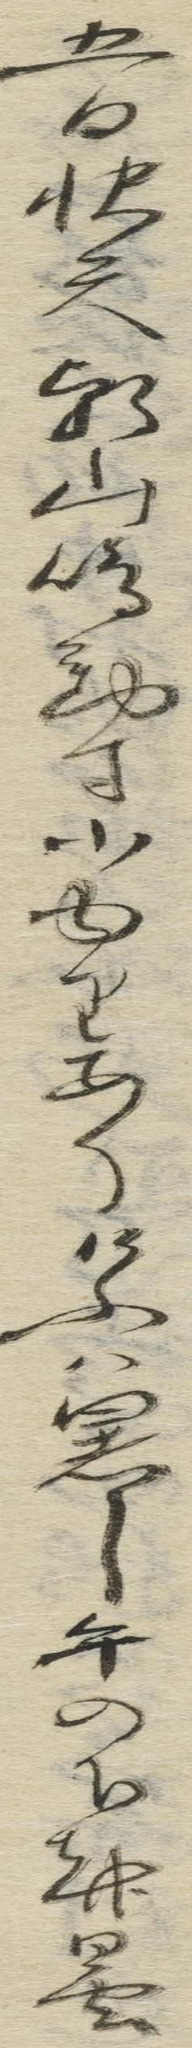五日快天朝山鳴動す小ゆりありけふハ暑し午の下刻曇
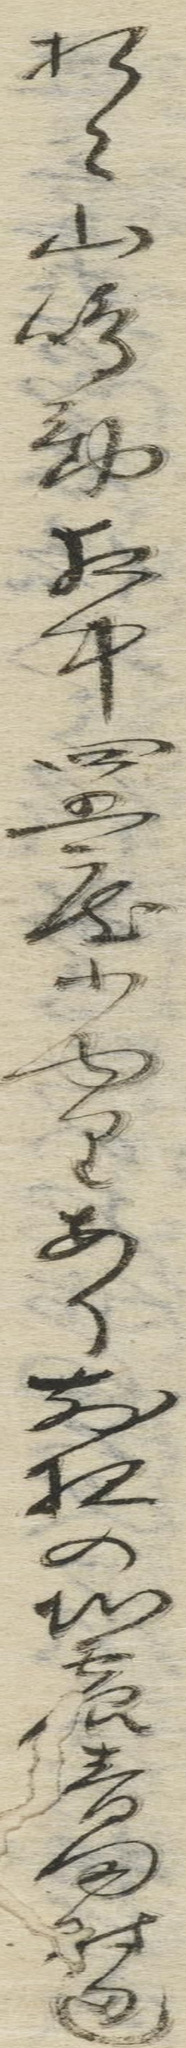折々山鳴動夜中四五度小ゆりあり前夜の地震青田村辺
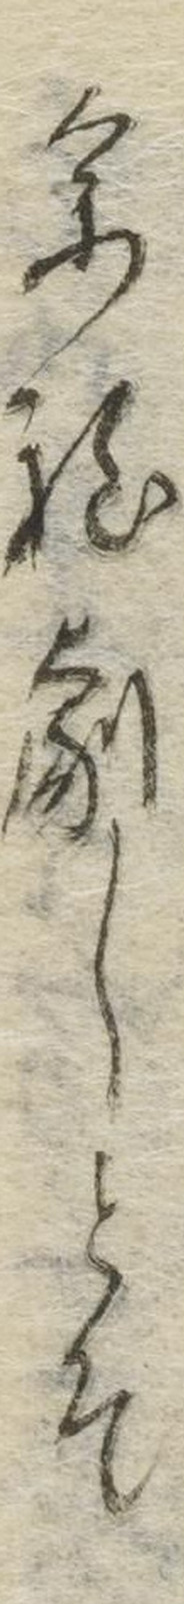余程劇しとそ
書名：弘化丁未天變日記
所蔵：東京大学地震研究所図書室 Earthquake Research Institute Library, The University of Tokyo, JAPAN
